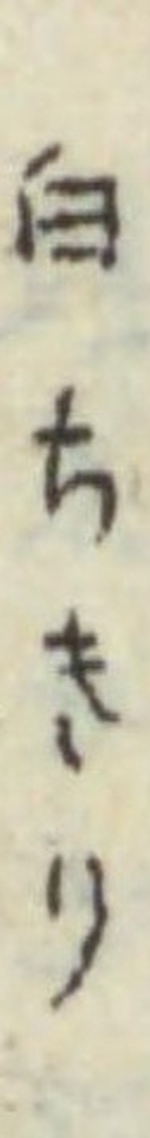白ちきり
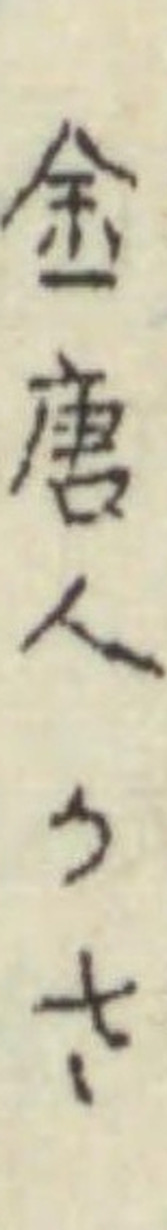金唐人かた
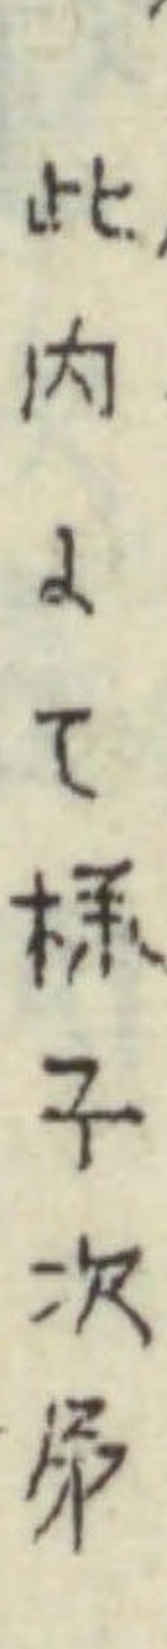此内にて様子次第
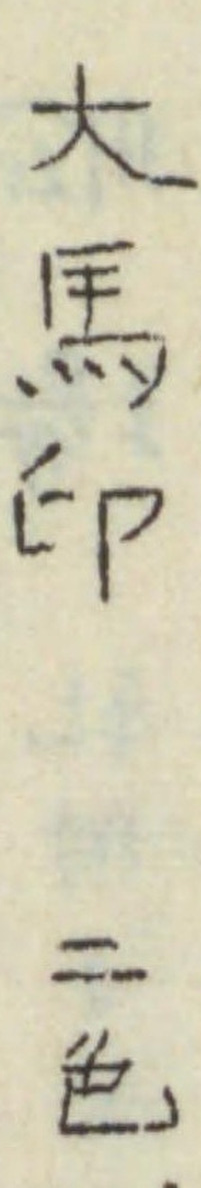小馬印二色
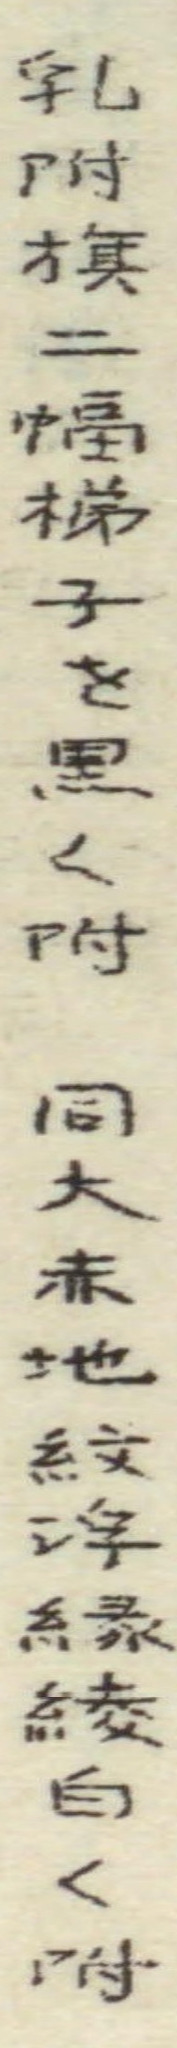乳付旗二幅梯子を黒く附同大赤地紋浮緑綾白く附
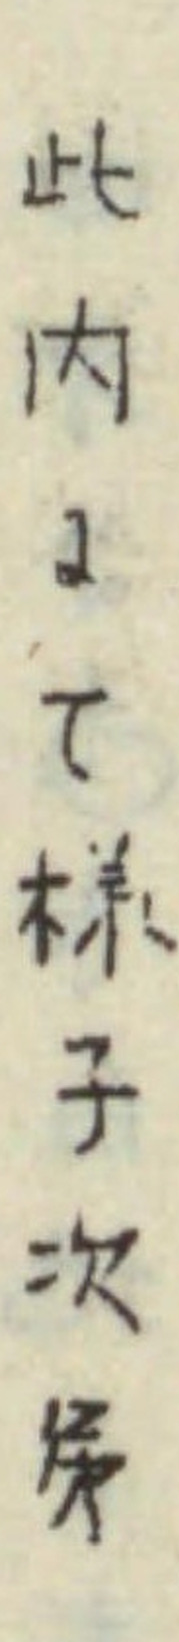此内にて様子次第
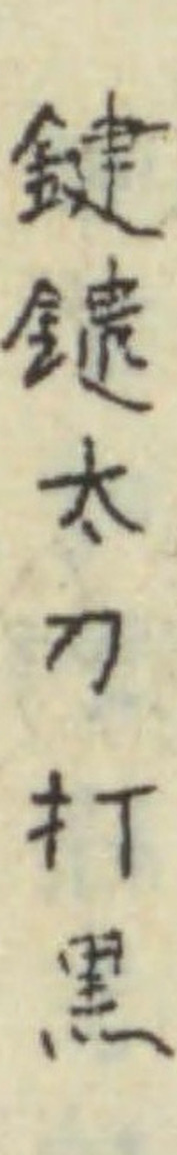鍵鑓太刀打黒

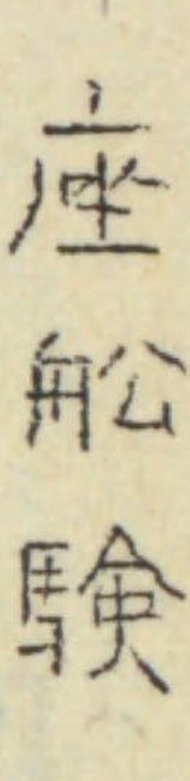座船験
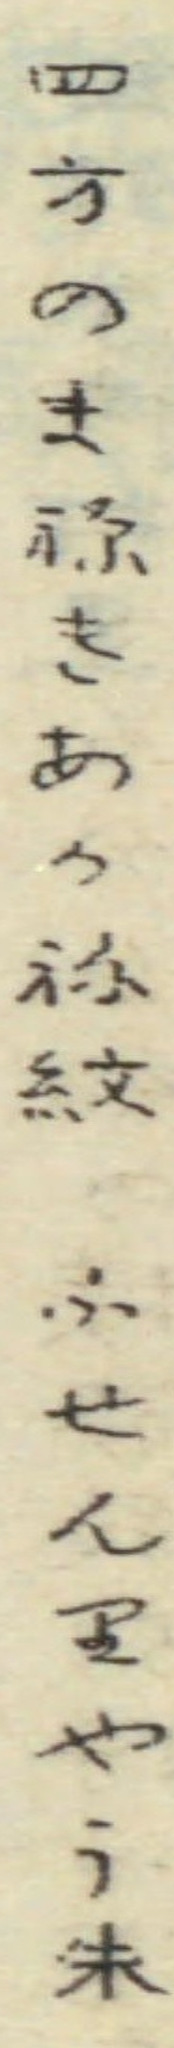四方のまねきあか緑紋ふせんりやう朱
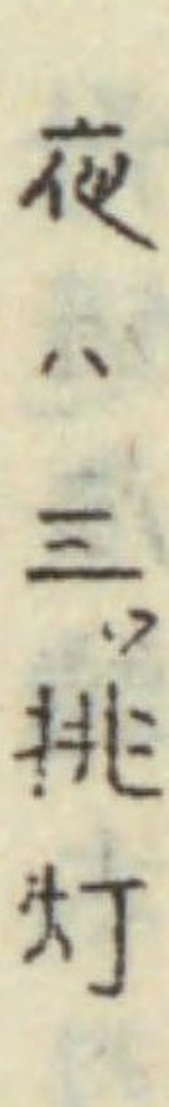夜ハ三ッ挑灯
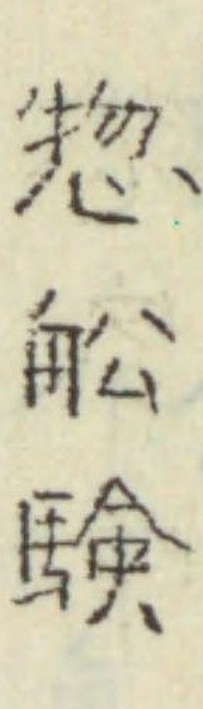惣船験
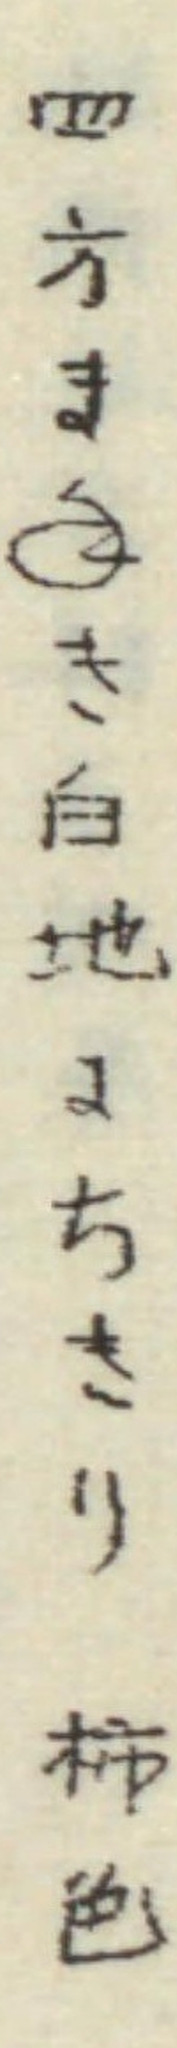四方まねき白地にちきり柿色
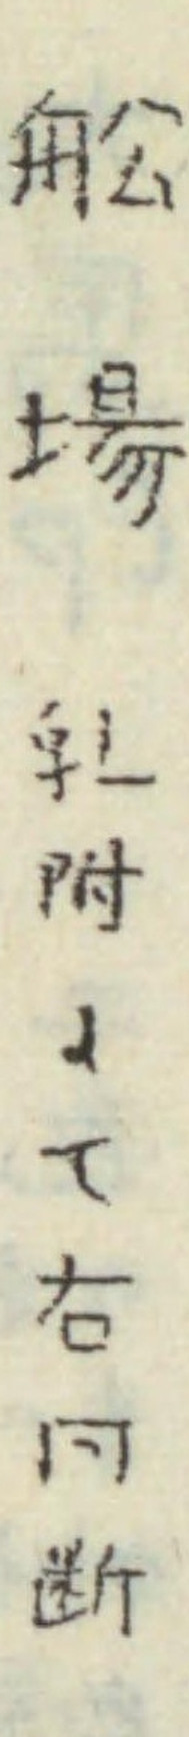船場乳附にて右同断
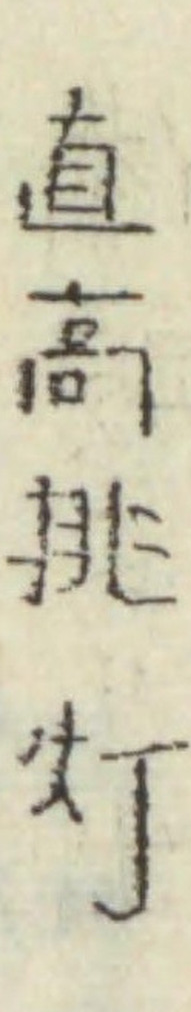直高挑灯
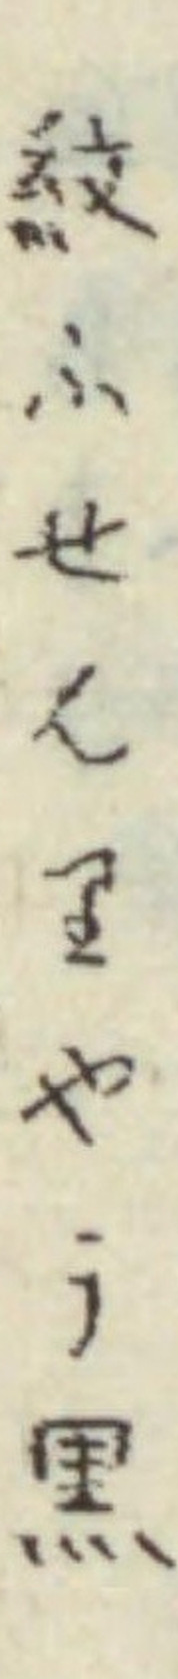紋ふせんりやう黒
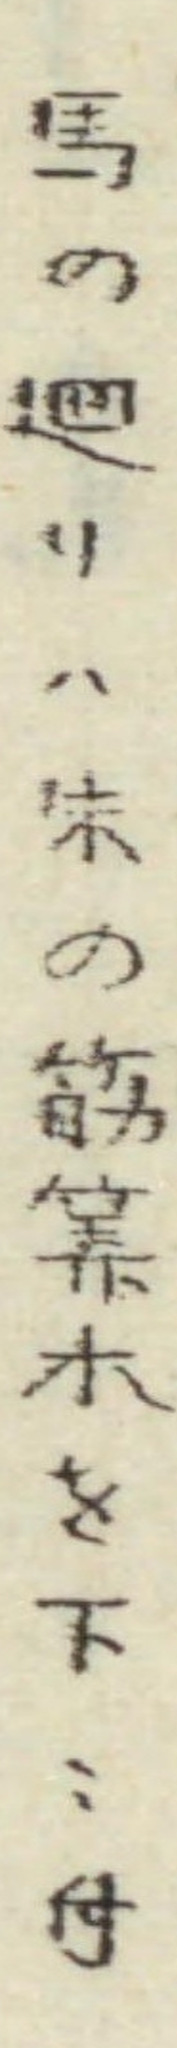馬の廻りハ朱の筋算木を下二付
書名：三河吉田藩動員史料
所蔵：国立国会図書館 National Diet Library, JAPAN
